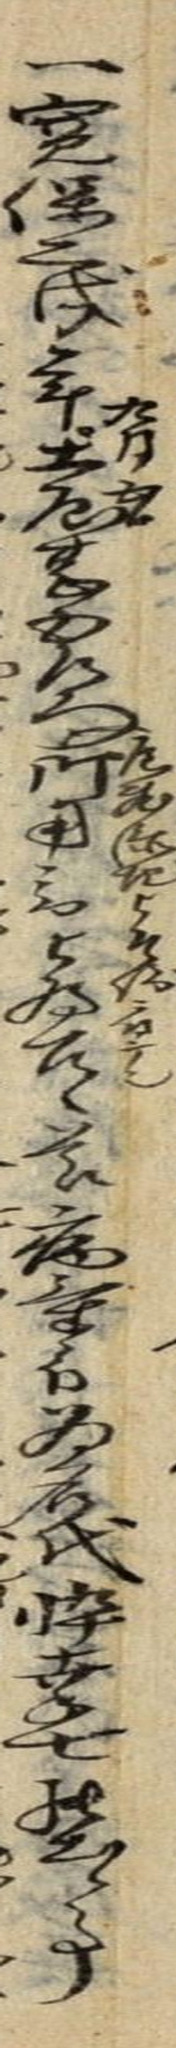一寛保二戌年九月五日土屋甚五左衛門御用に而被為召候節病気に付為名代忰幸七罷出候事
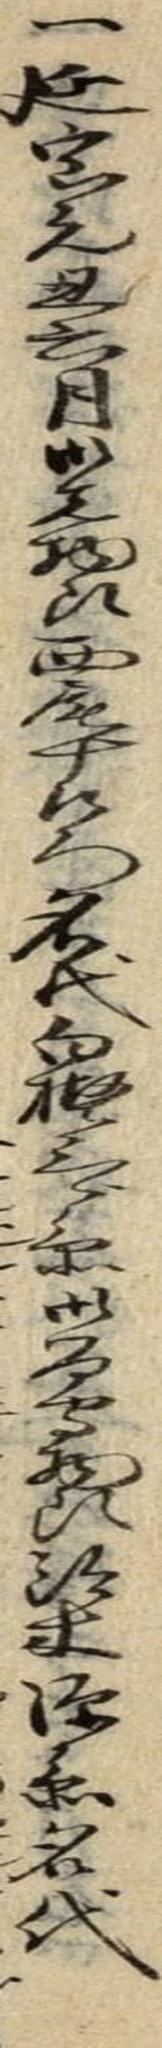一延宝元丑六月御先物頭西尾十左衛門名代白樫三郎兵衛御留守物頭鈴木源兵衛名代
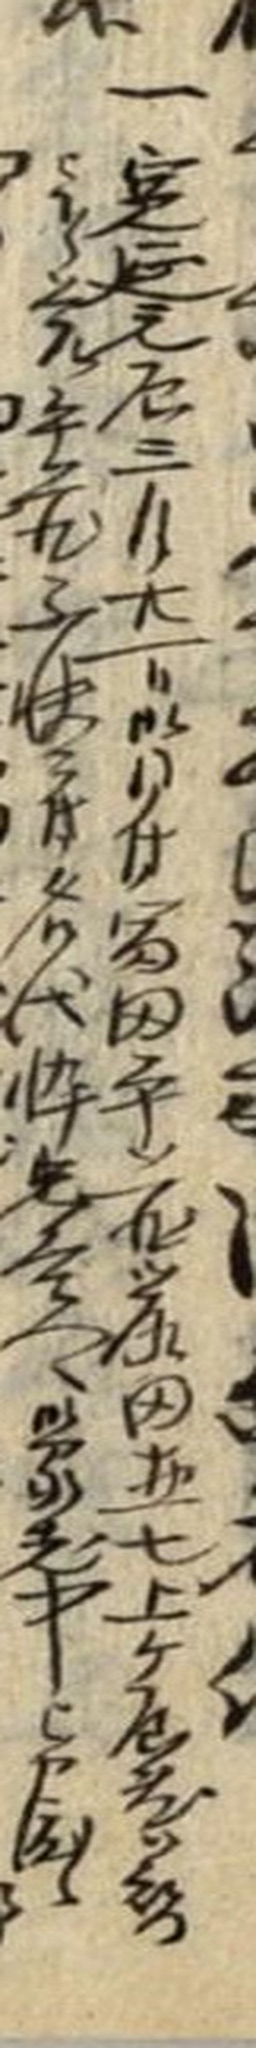被下候節平蔵不快に付名代忰忠太夫へ御家老中被申渡候事
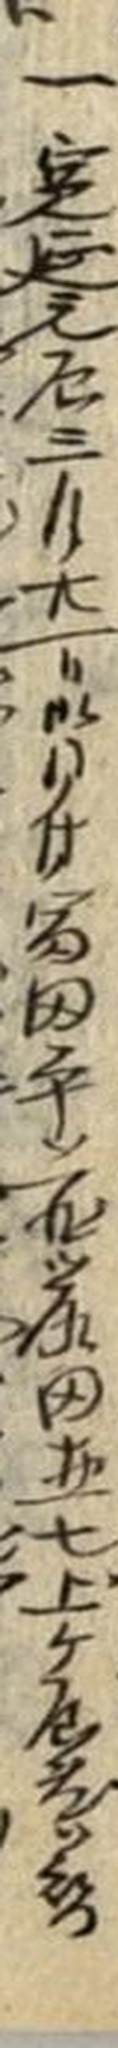一寛延元辰三月廿一日御目付冨田平蔵厳田惣七上ケ屋敷御替
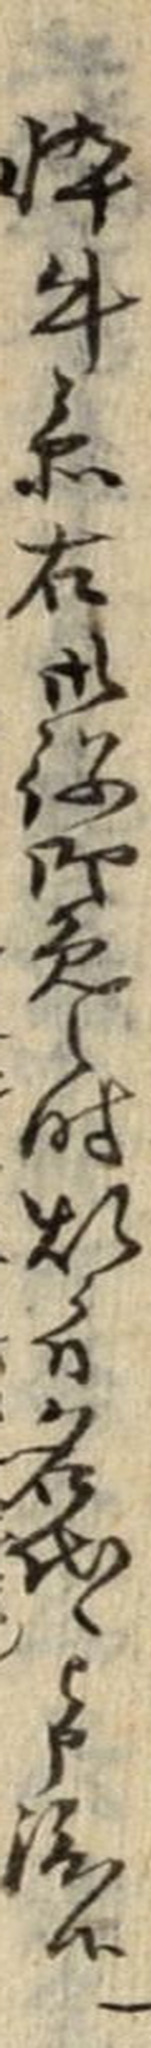忰牛兵衛右御役御免之時煩に付名代へ被申渡候
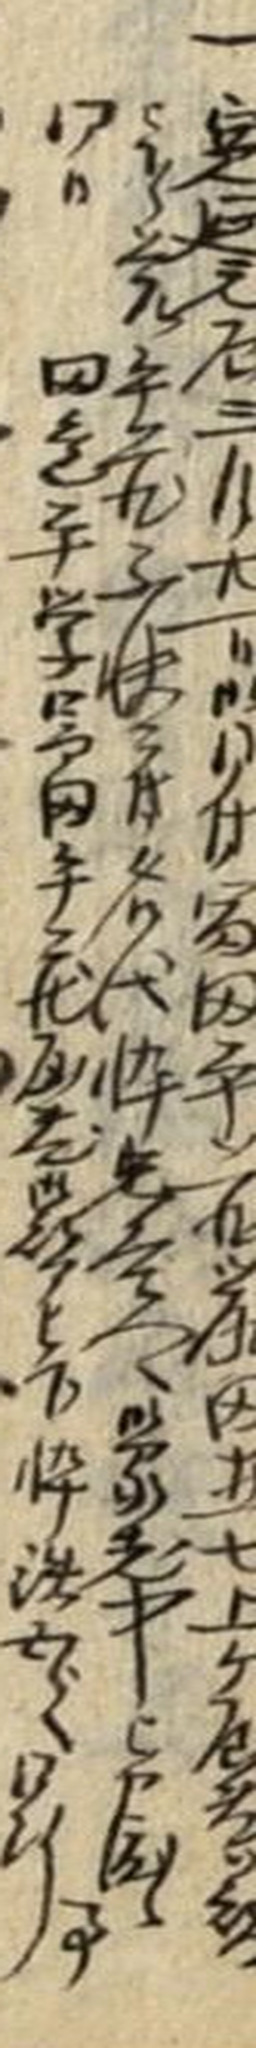同日田辺平学冨田平蔵屋敷替被下忰鉄五郎へ同断
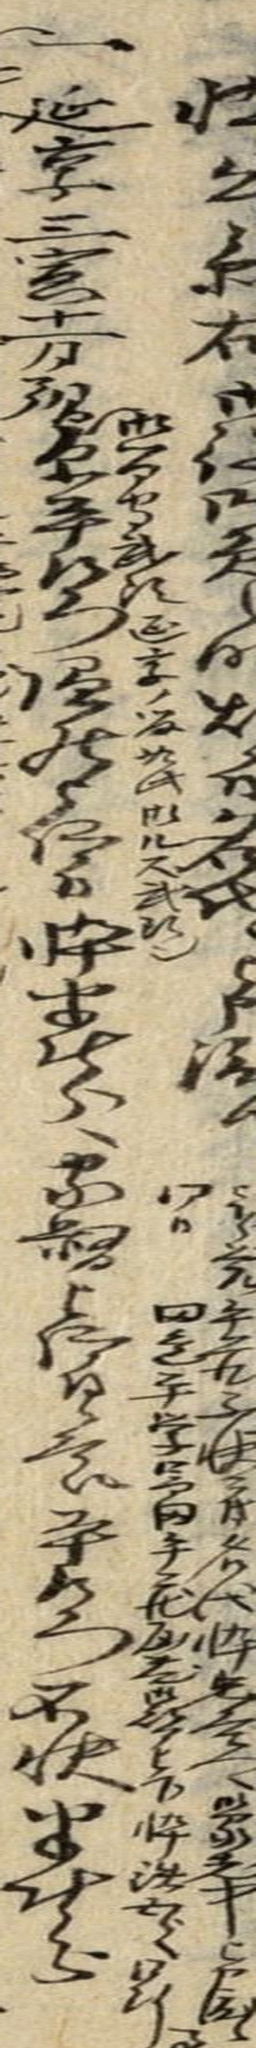一延享三寅十一月朔日原平左衛門隠居被仰付忰半次郎へ家督被仰付候節平左衛門不快半次郎
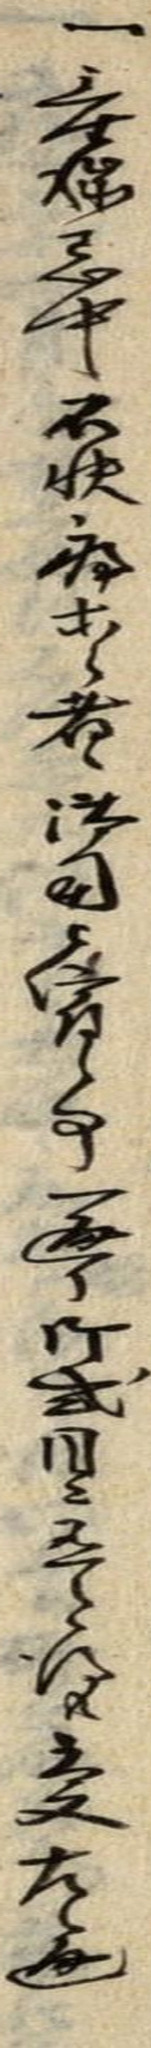一産穢忌中不快病等之者へ御用被仰付候事一通り御式目に有之候得共尚又左之通
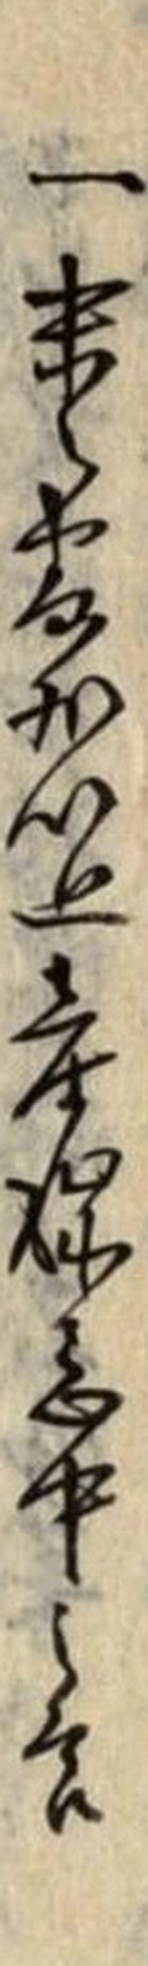一未之番外以上産穢忌中之節
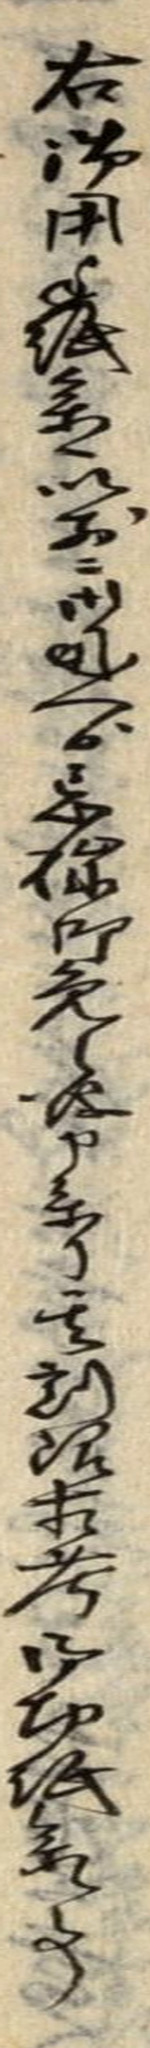右御用手紙参候以前に御用人ゟ忌穢御免之儀申参り其刻限相考御切紙参候事
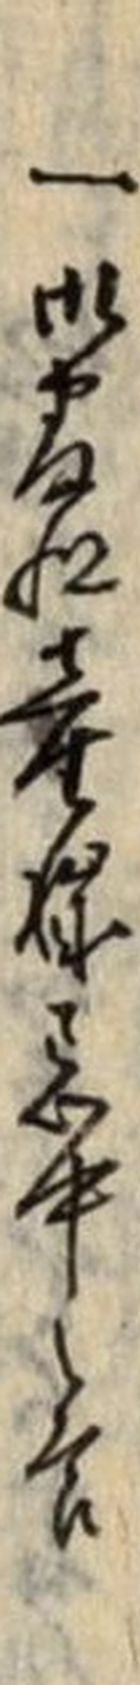一御番組産穢忌中之節
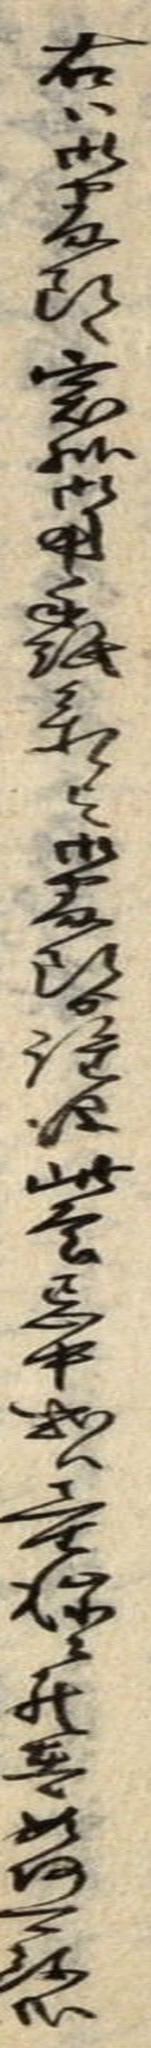右は御番頭へ突掛御用手紙参候と御番頭ゟ誰儀此節忌中或は産穢に罷在候如何可致哉
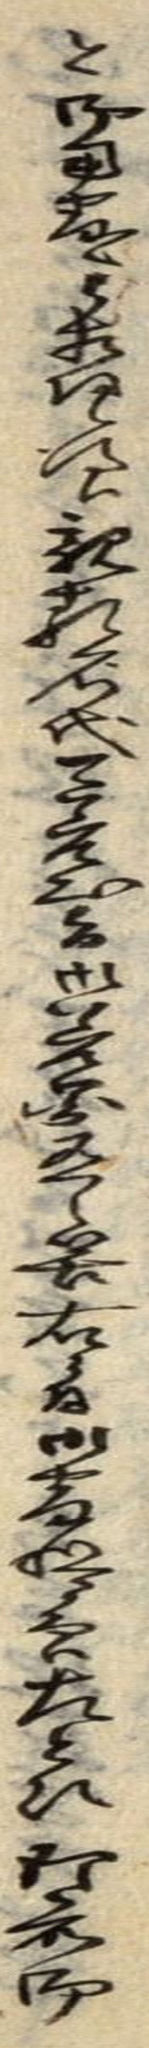と御用番へ被相伺候得は親類名代可差出旨御差図有之候筈右に付御番組に而はたとひ御前御
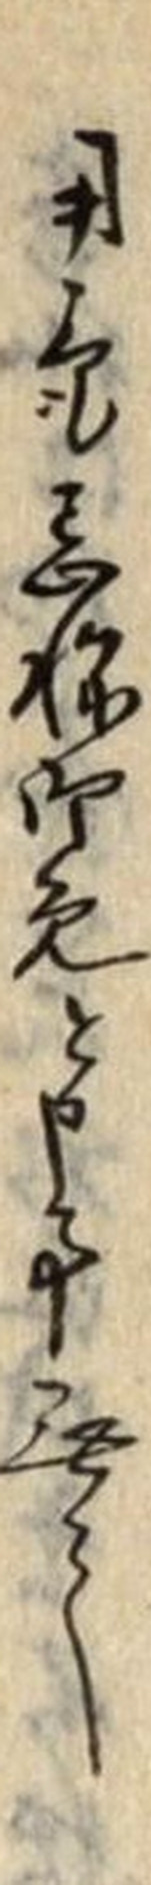用に而も忌穢御免と申事無之
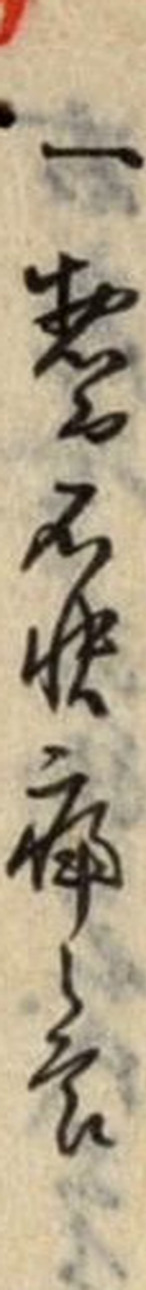一惣而不快痛之節

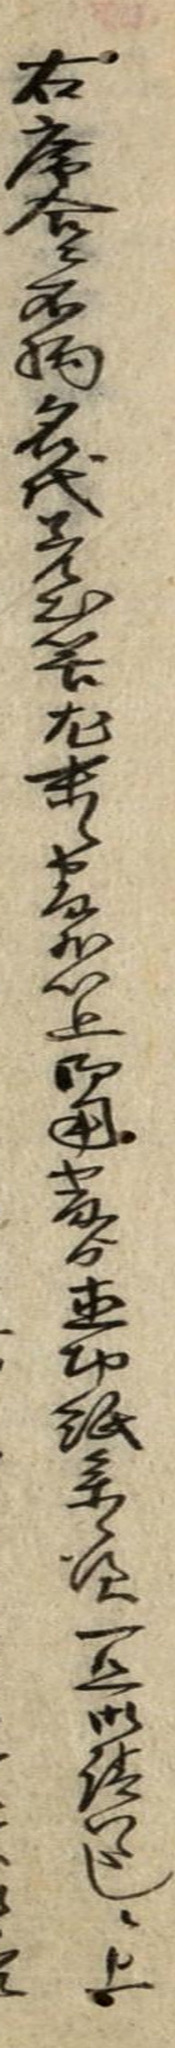右席合に不拘名代差出筈尤未之番外以上御用番ゟ直切紙参候得は一旦御請いたし候上
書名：御用并被仰出之部
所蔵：福井県文書館 Fukui Prefectural Archives
